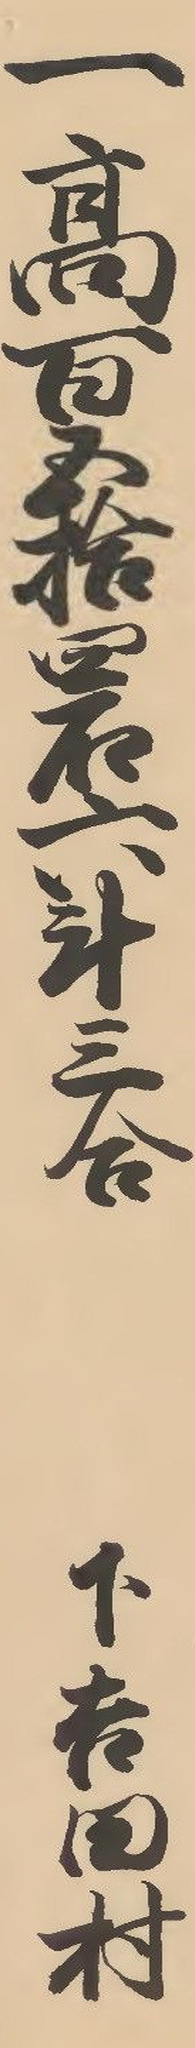一高百五拾四石六斗三合下吉田村
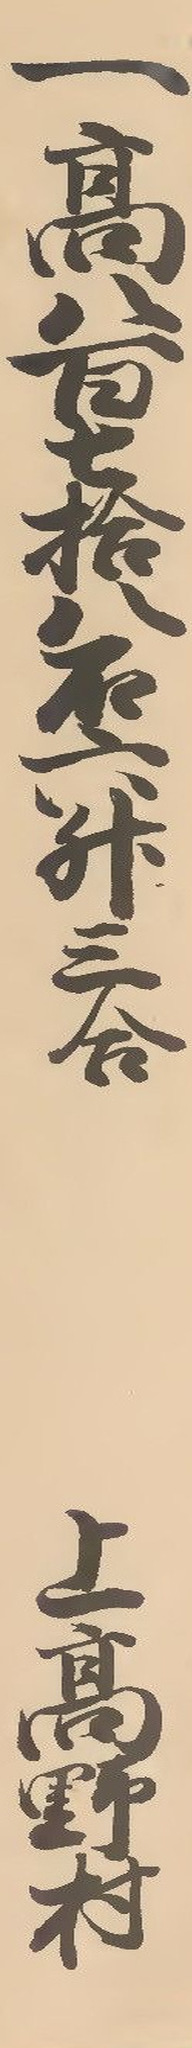一高八百七拾八石六升三合上高野村
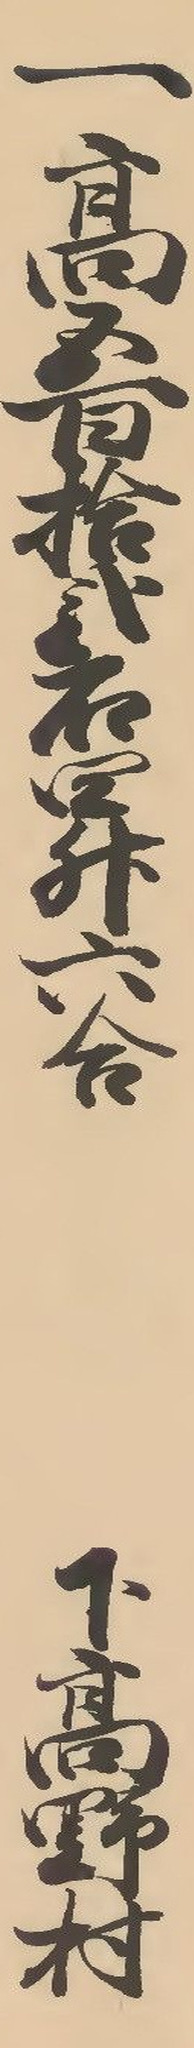一高五百拾弐石四升六合下高野村
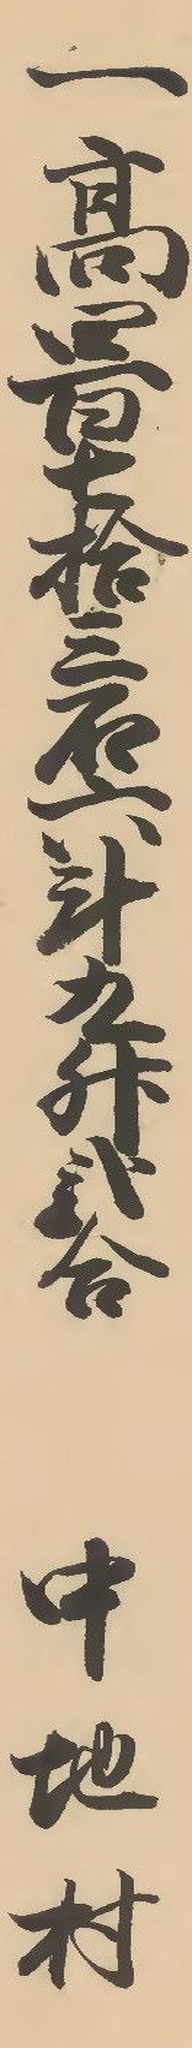一高四百七拾三石六斗九升弐合中地村
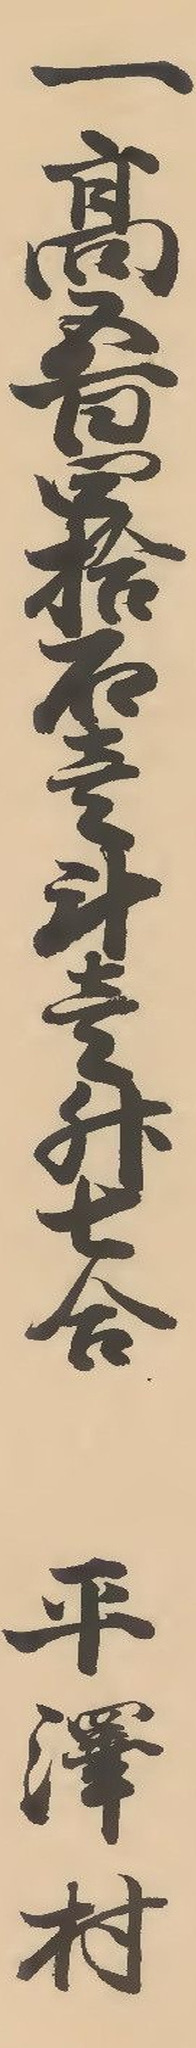一高五百四拾石壱斗壱升七合平沢村

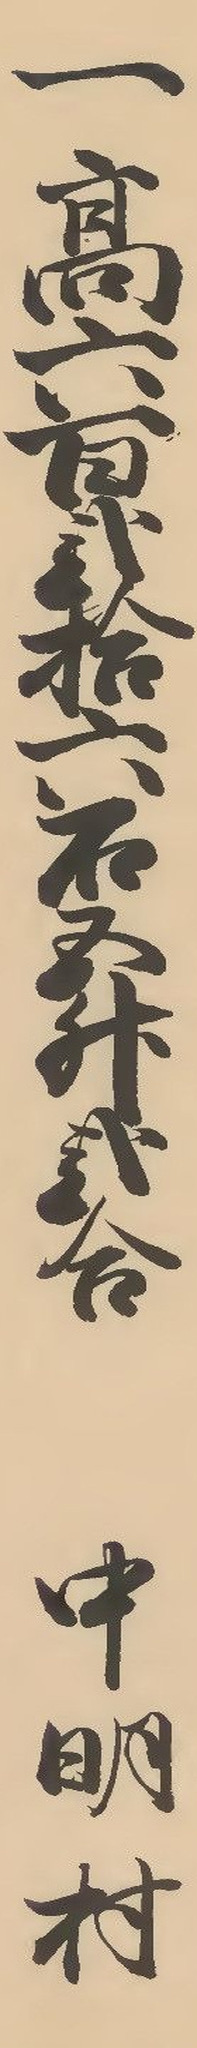一高六百弐拾六石五升弐合中明村
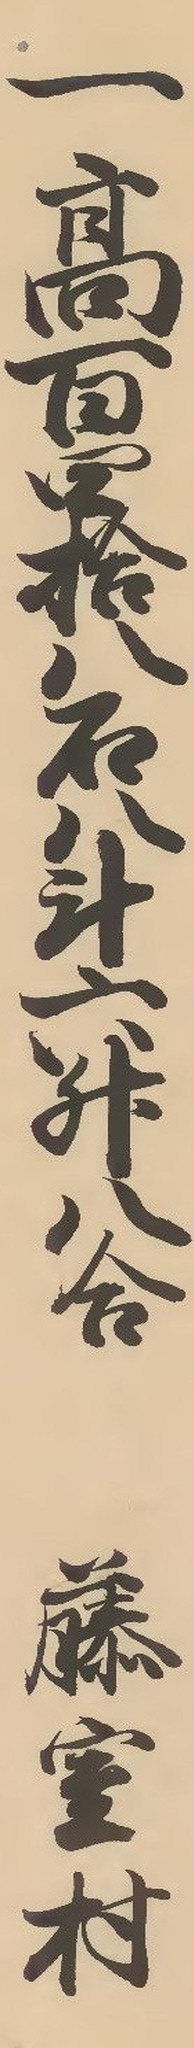一高百四拾八石斗八六升八合藤室村
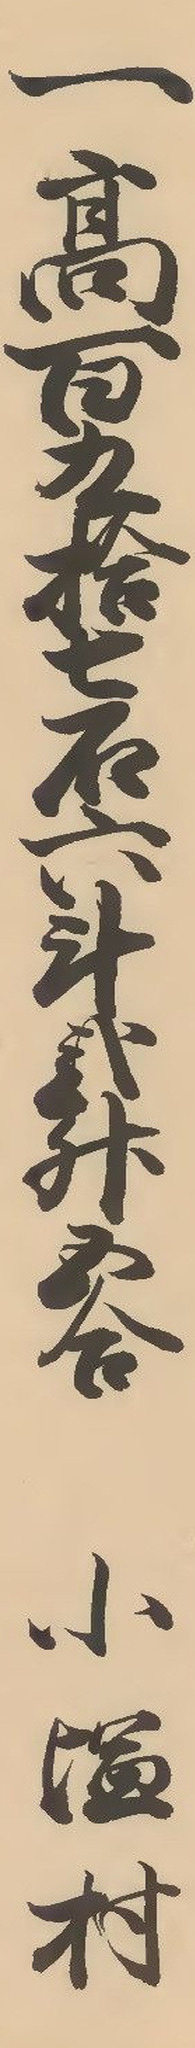一高百九拾七石六斗弐升五合小塩村
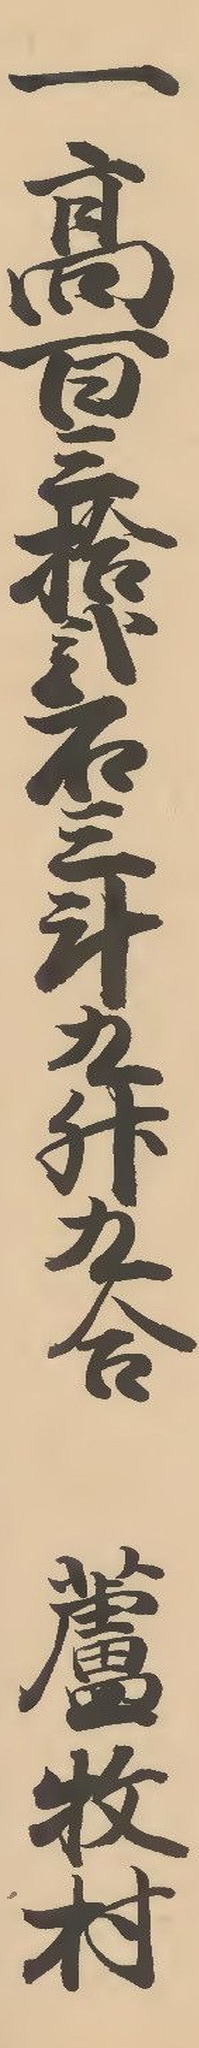一高百三拾弐石三斗九升九合芦牧村
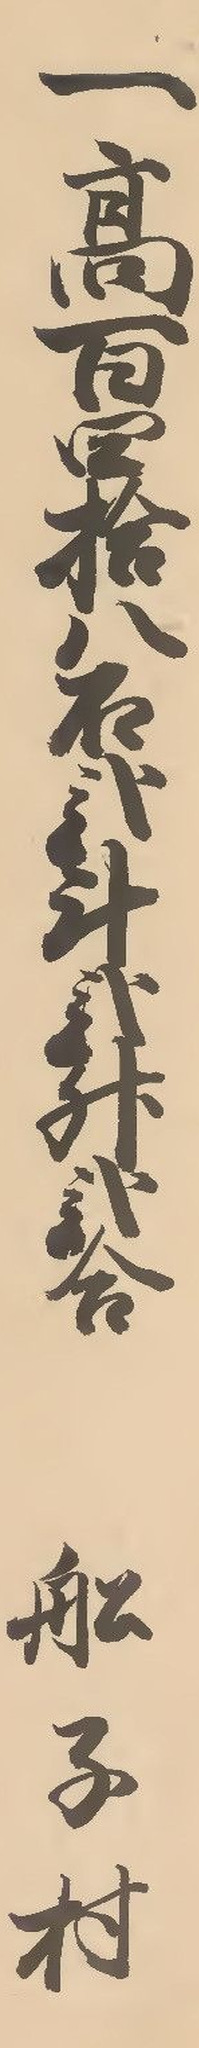一高百四拾八石弐斗弐升弐合船子村
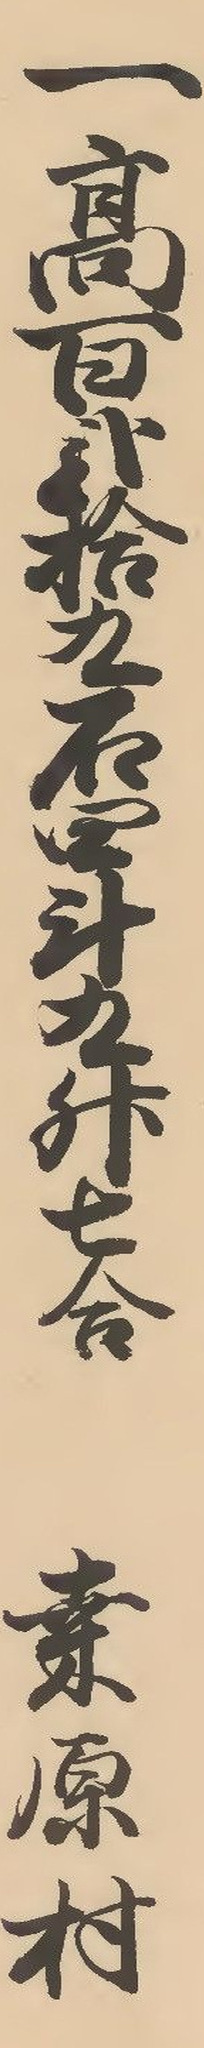一高百弐拾九石四斗九升七合桑原村
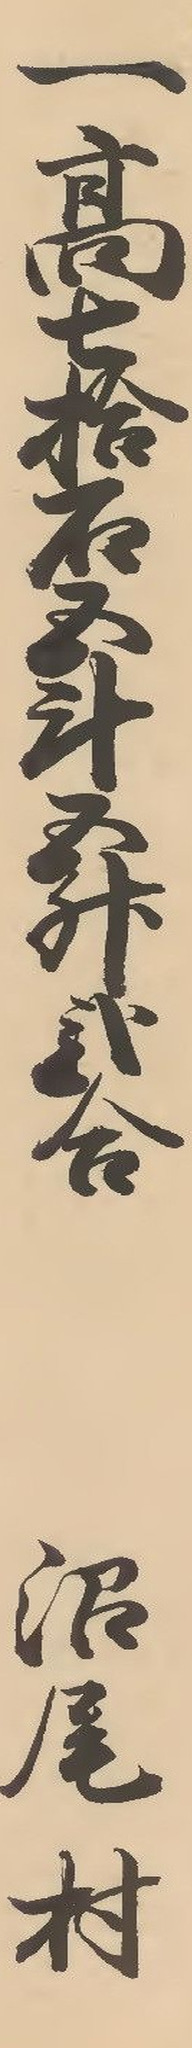一高七拾石五斗五升弐合沼尾村
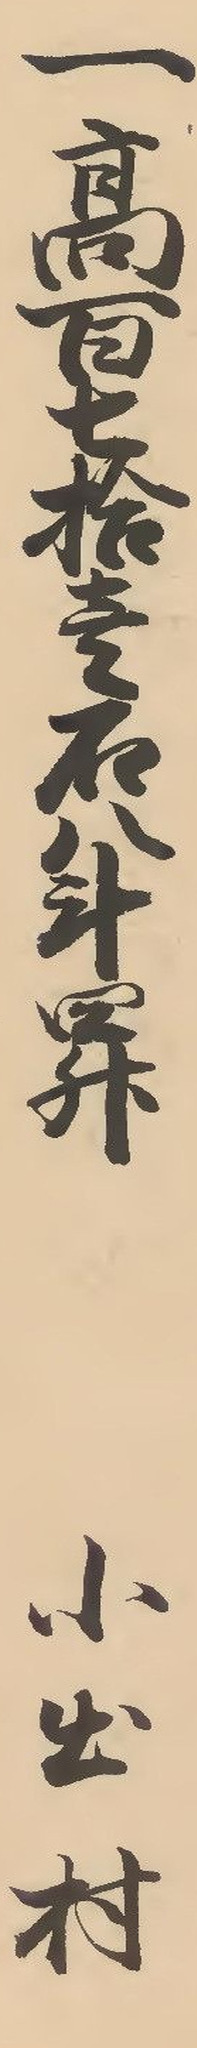一高百七拾壱石八斗四升小出村

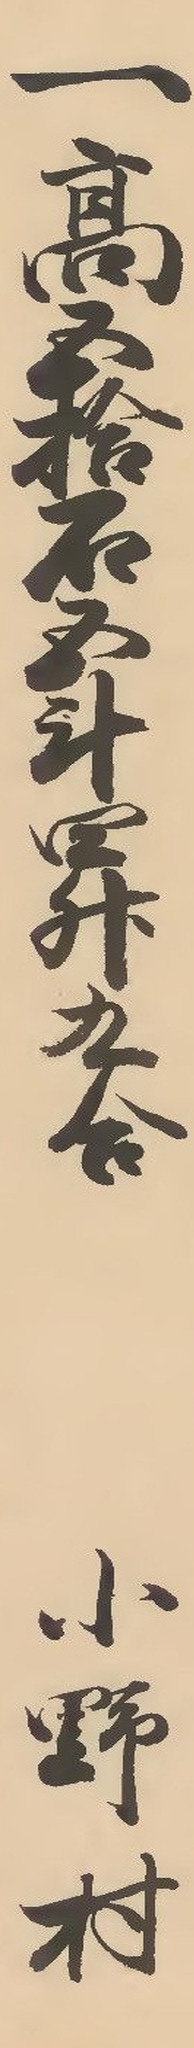一高五拾石五斗四升九合小野村
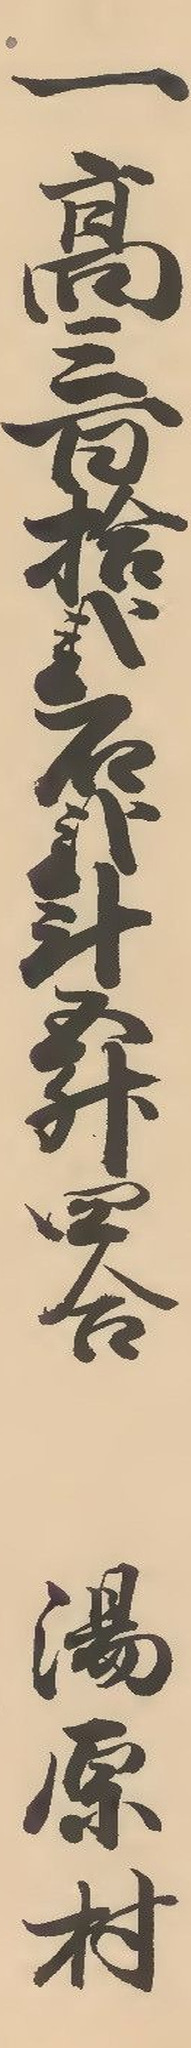一高三百拾弐石弐斗五升四合湯原村
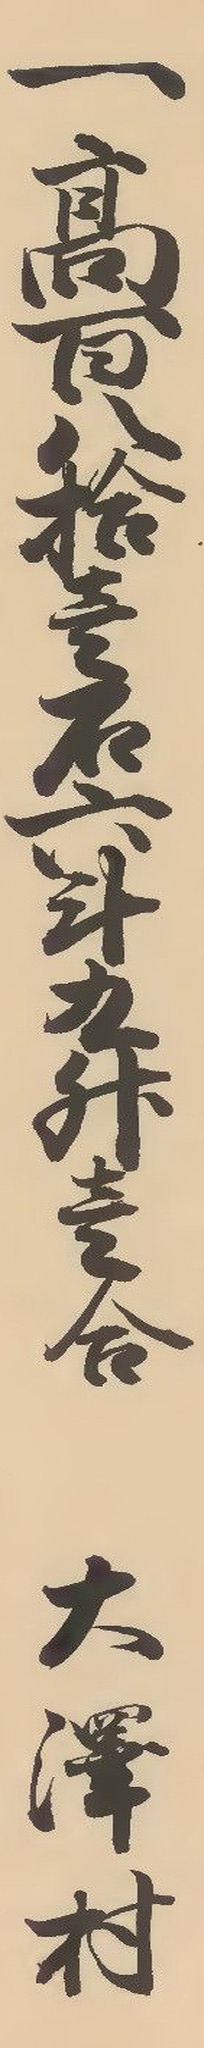一高百八拾壱石六斗九升壱合大沢村
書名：陸奥国郷帳　１
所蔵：国立公文書館 National Archives of Japan
